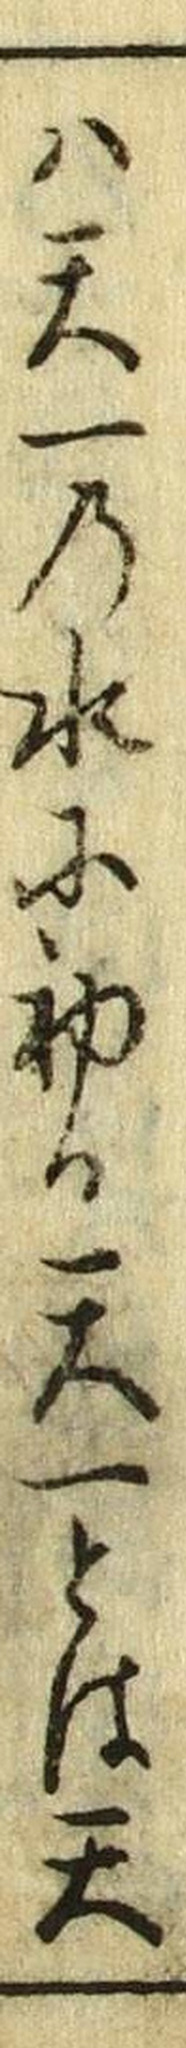は天一の水に初る天一とは天

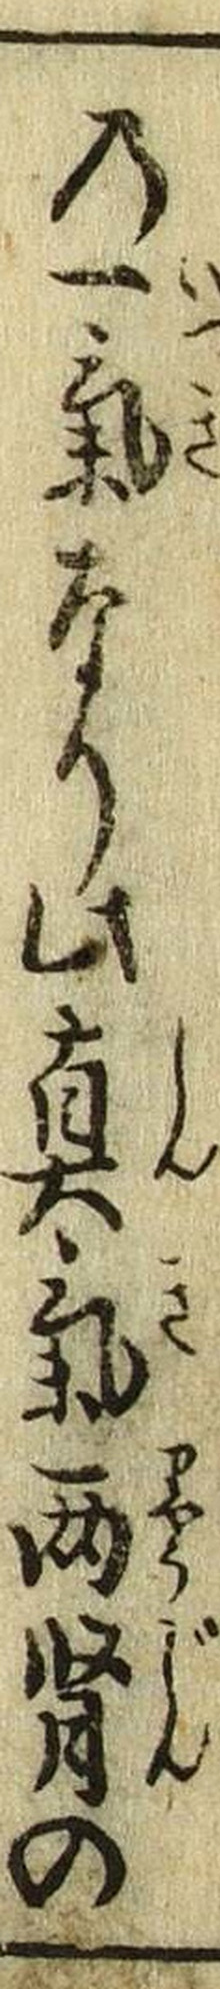の一気なり此真気両腎の
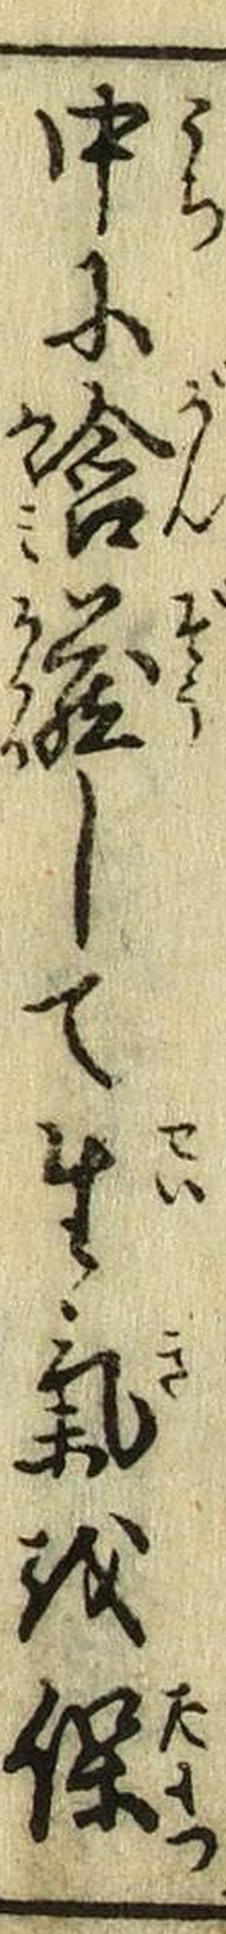中に含蔵して生気を保
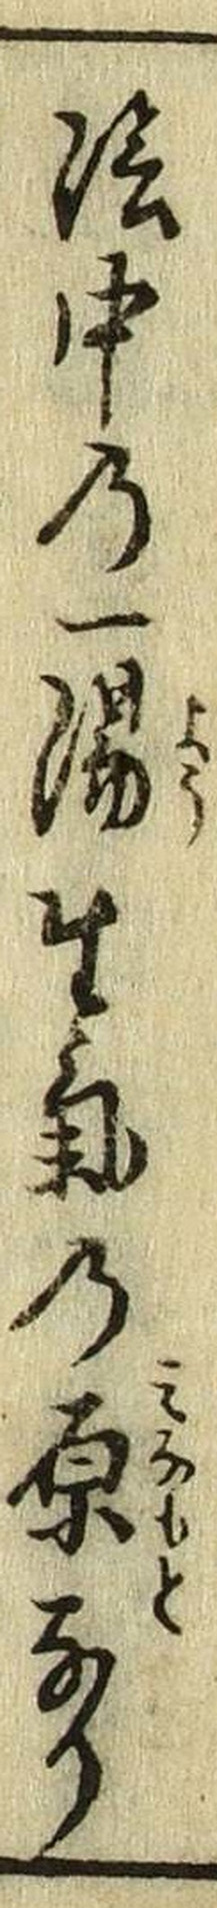陰中の一陽生気の原なり
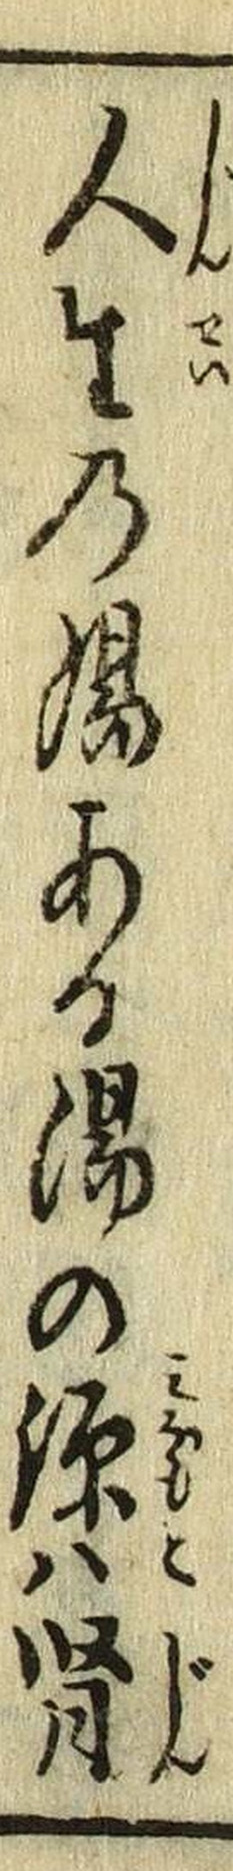人生の陽ある陽の源は腎
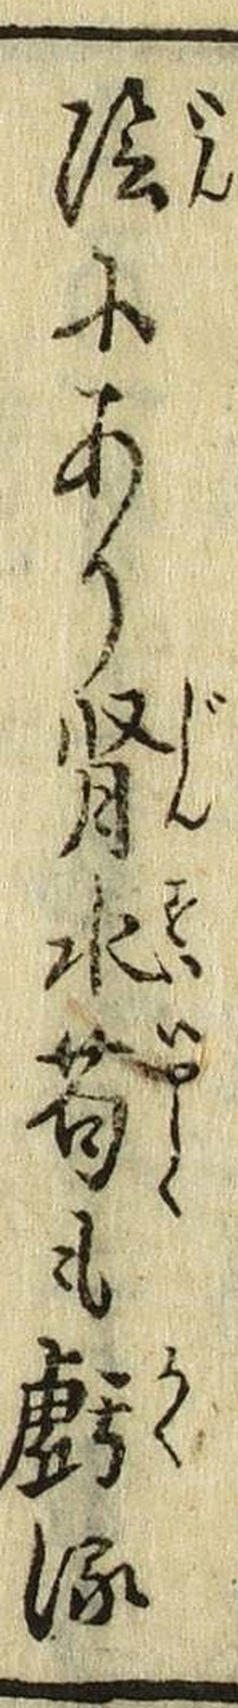陰にあり腎水苟も虧る
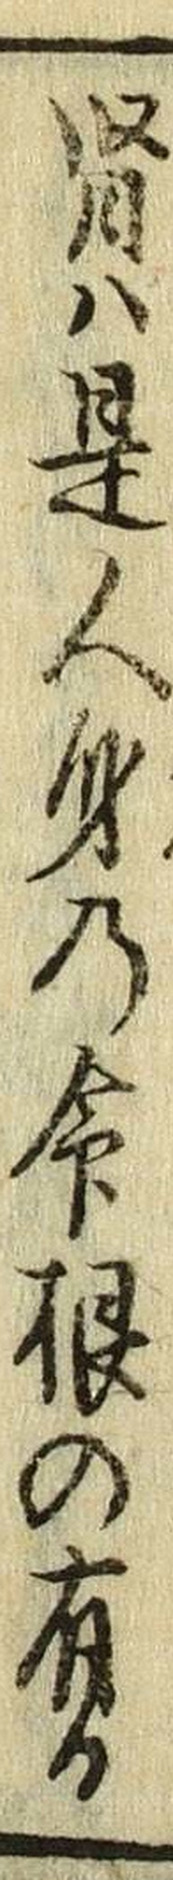腎は是人身の命根の有る
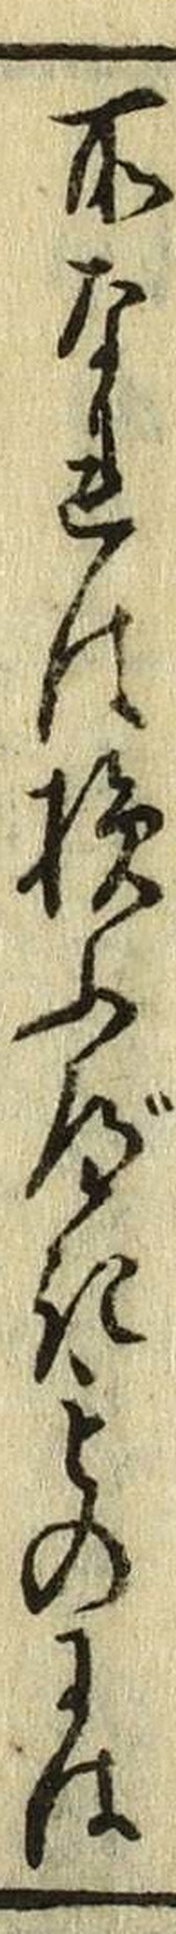所なれは損ふべきものには
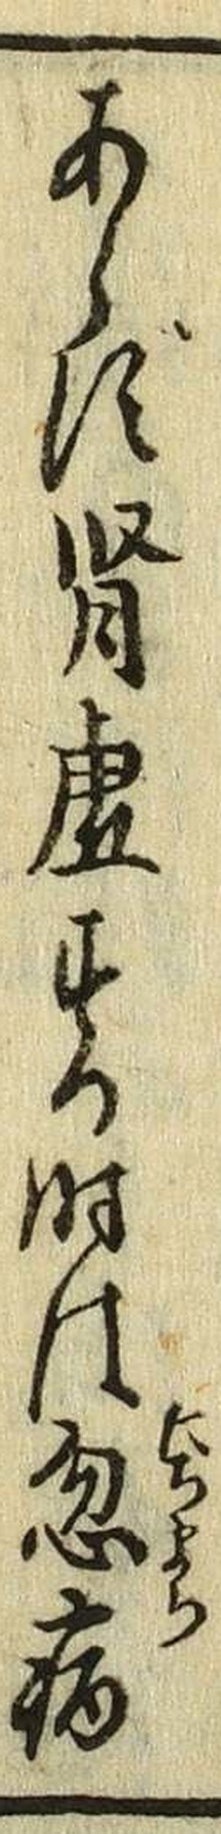あらず腎虚する時は忽病
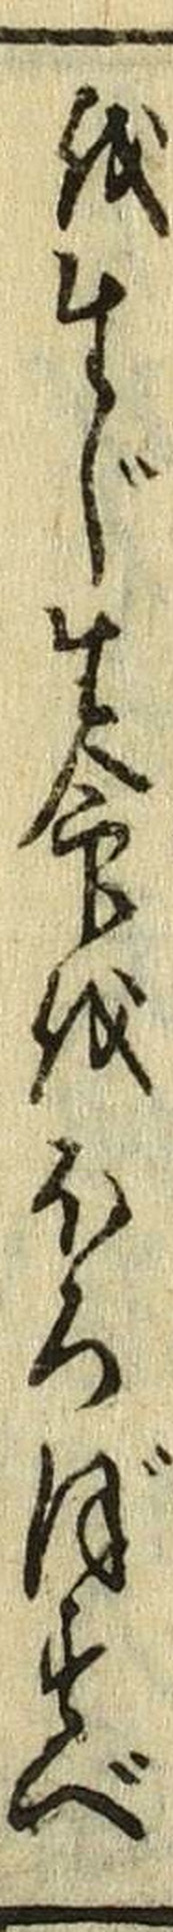を生じ生命をほろぼすべ
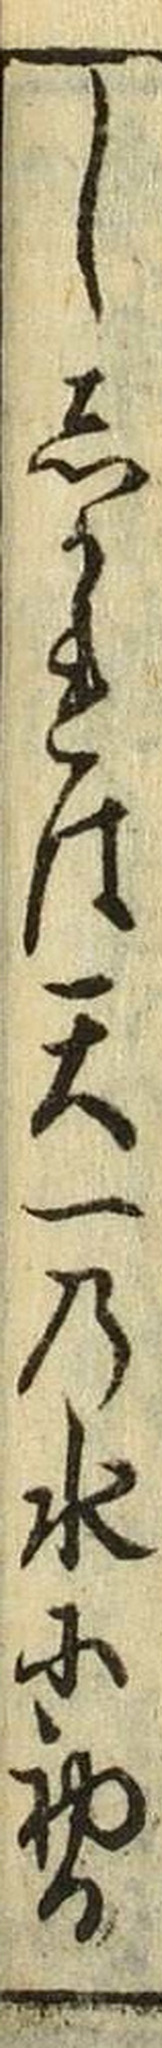ししかれは天一の水に初る
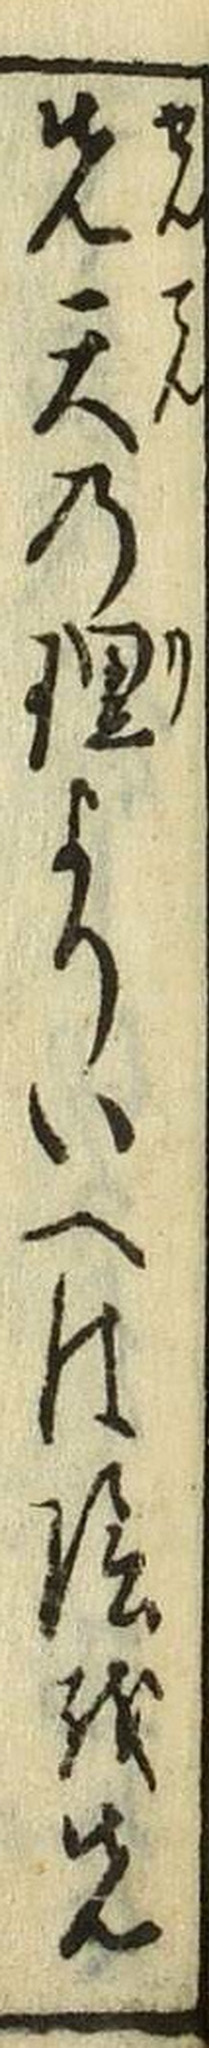先天の理よりいへは陰を先
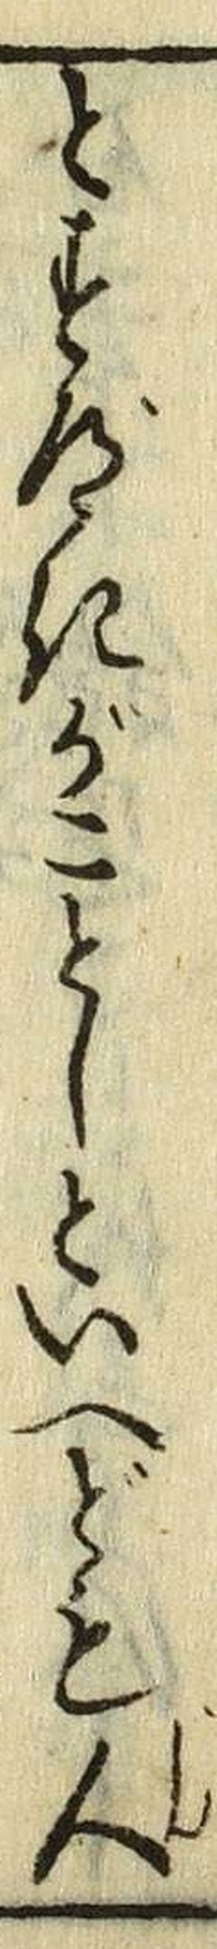とすべきがことしといへども人
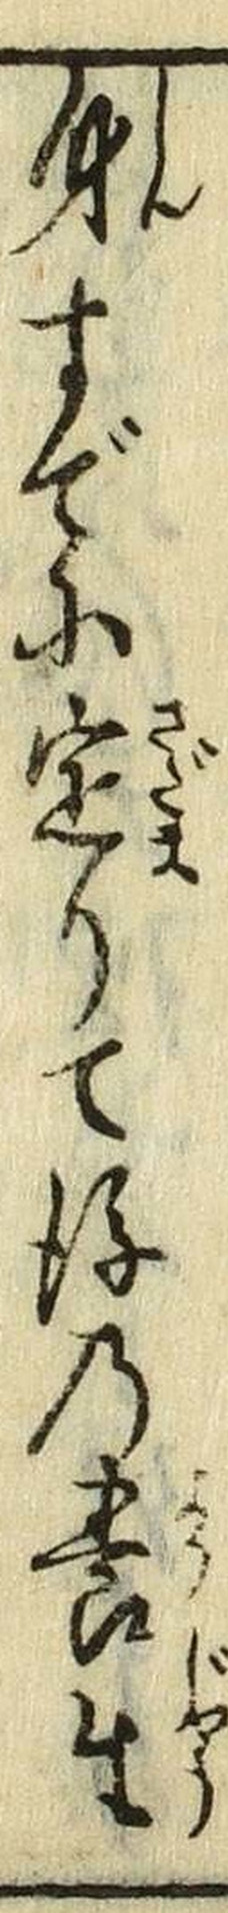身すでに定りて後の養生
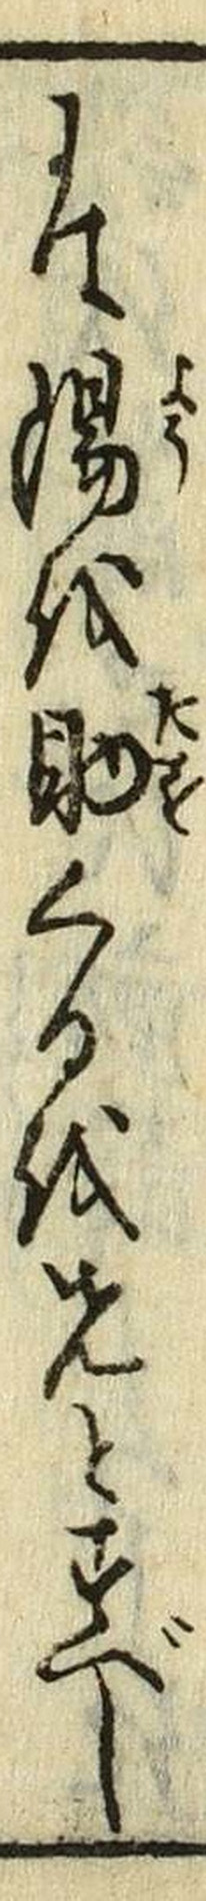には陽を助くるを先とすべし
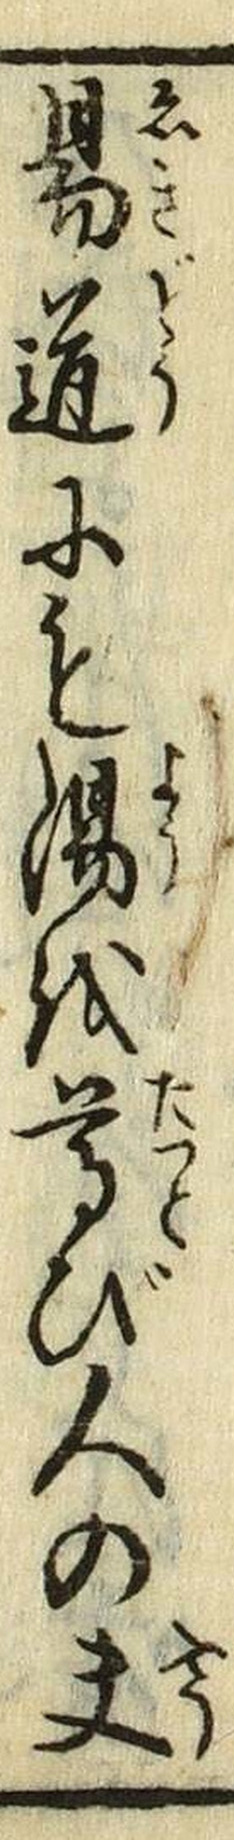易道にも陽を尊び人の夫
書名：居家養生記
